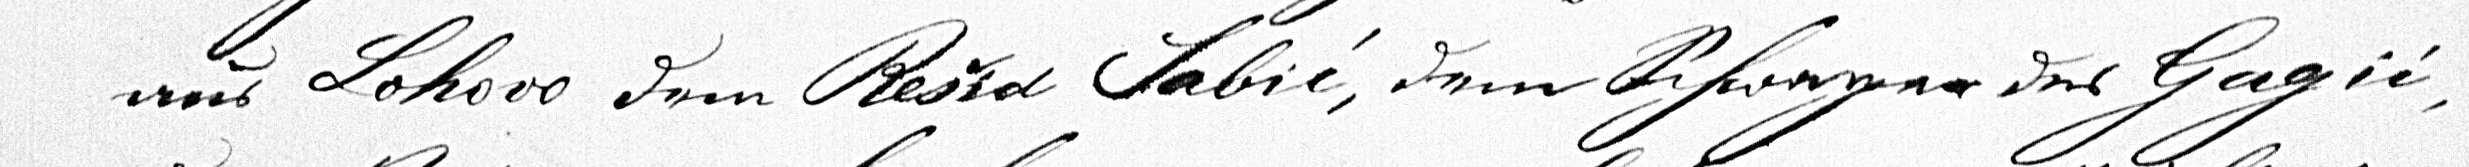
aus Lohovo dem Rešid Sabić, dem Schwager des Gagić,
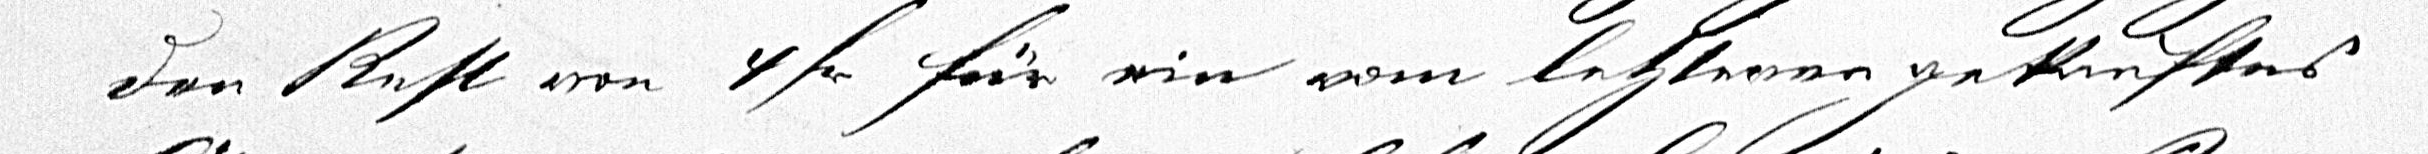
den Rest von 4 fr für ein vom letzteren gekauftes
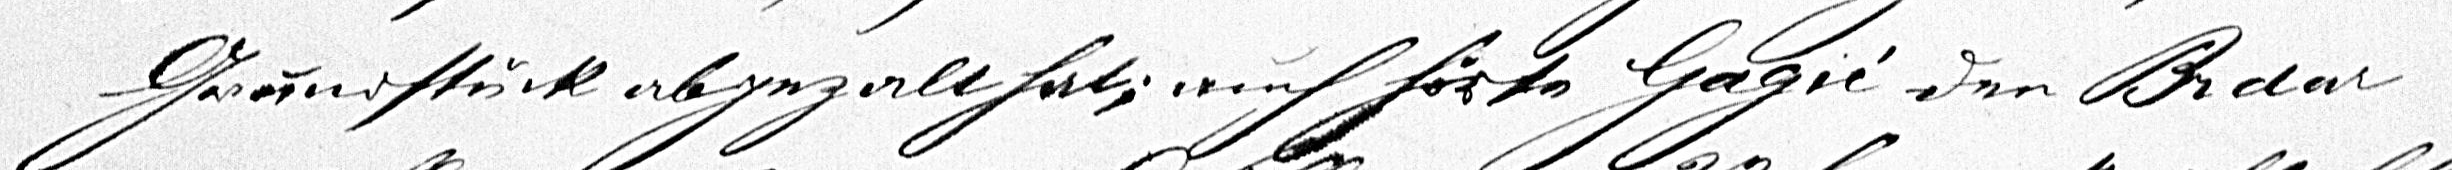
Grundstück abgezalt hat; auch hörte Gagić den Braxx
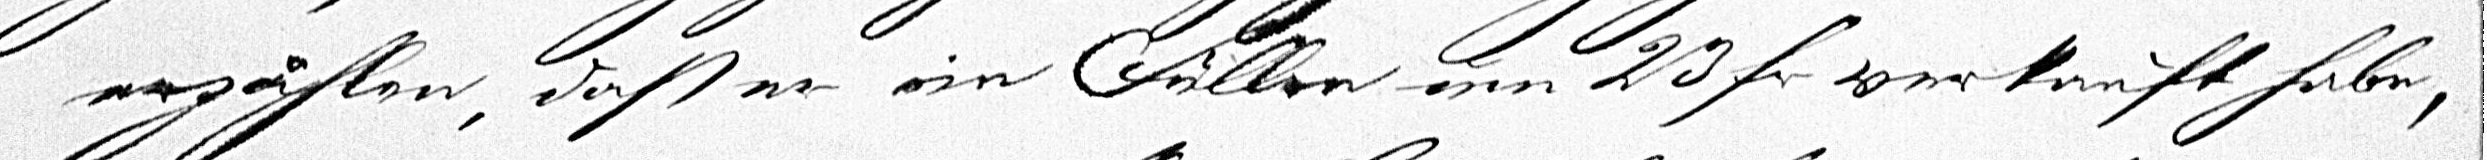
erzählen, daß er ein Füllen um 23 fr verkauft habe,
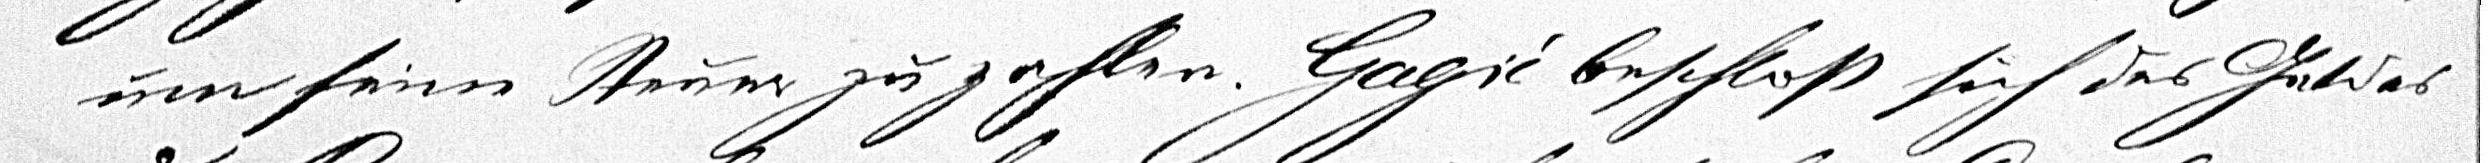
um seine Steuer zu zahlen. Gagić beschloß sich des Geldes
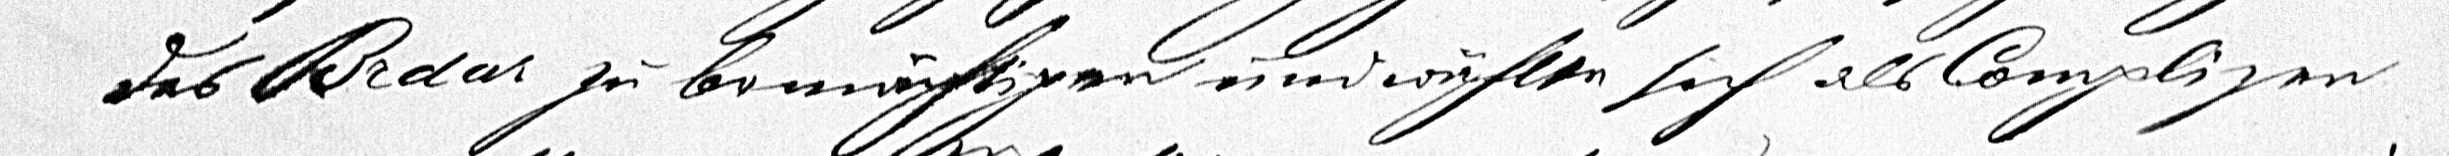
des Brdar zu bemächtigen und wählte sich als Complizen
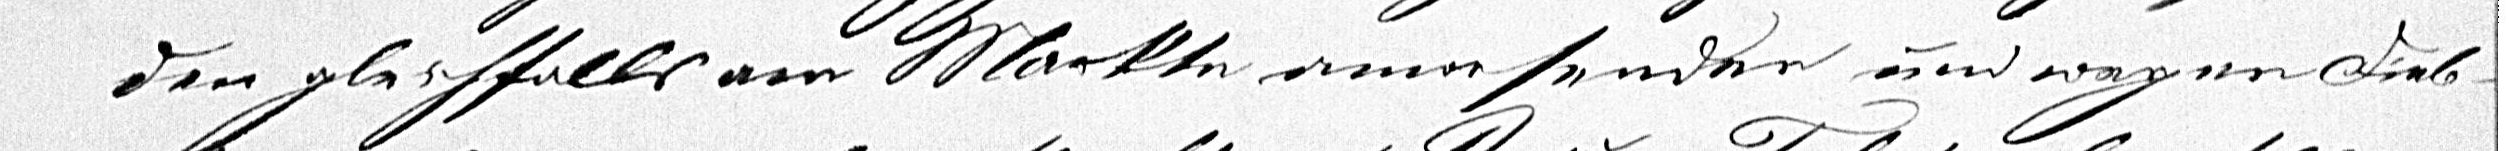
den gleichfalls am Markte anwesenden und wegen Dieb¬
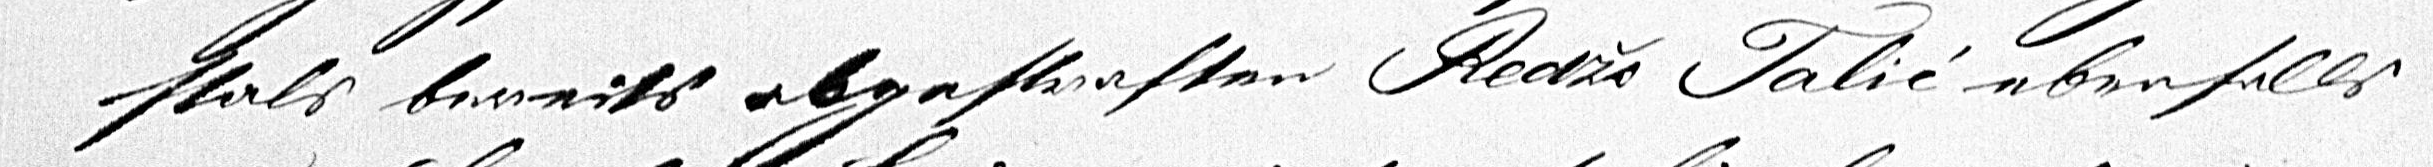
stals beweibs abgestraften Redžo Talić ebenfalls
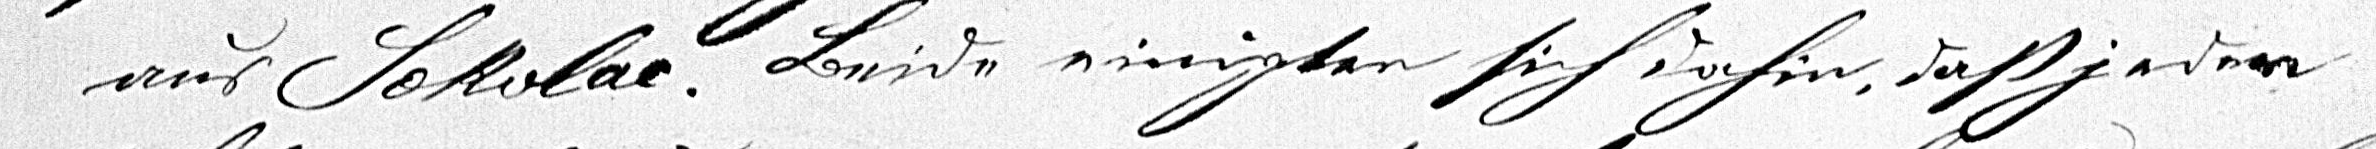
aus Sokolac. Beide einigten sich dahin, daß jeden
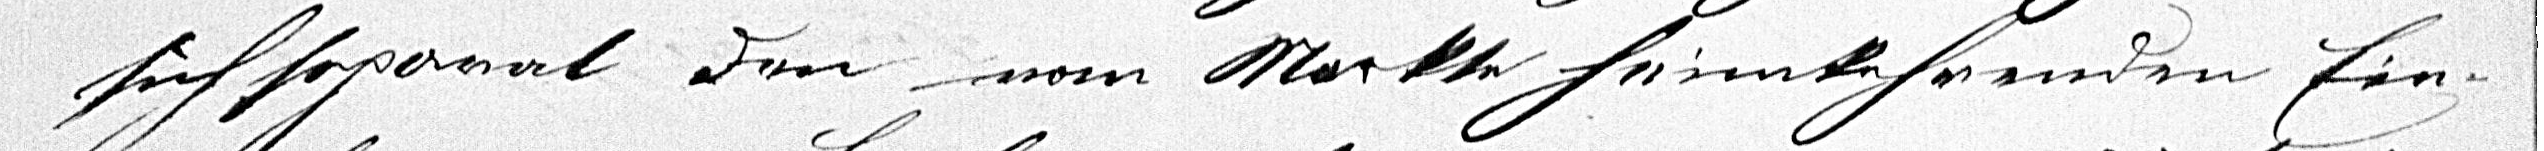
sich xxporal den vom Markte heimkehrenden Ein¬
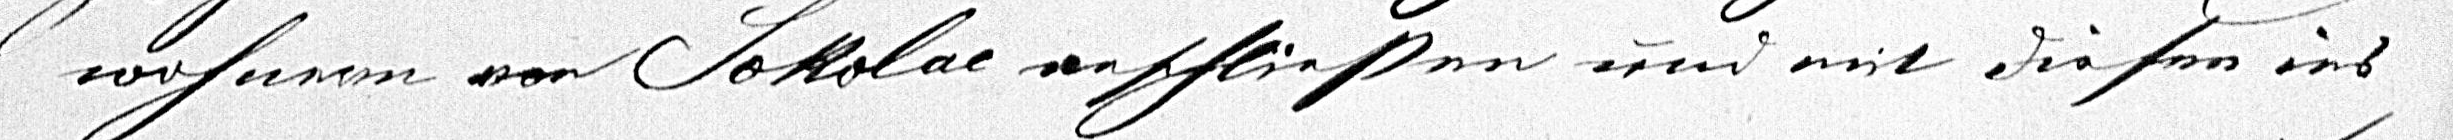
wohnern von Sokolac anschließen und mit diesen ins
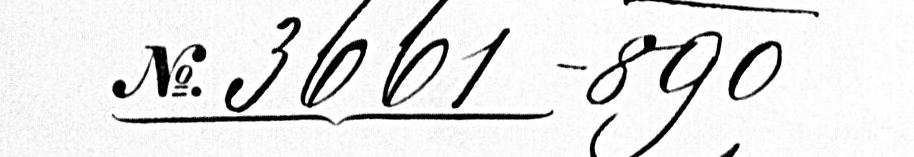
N° 3661-890
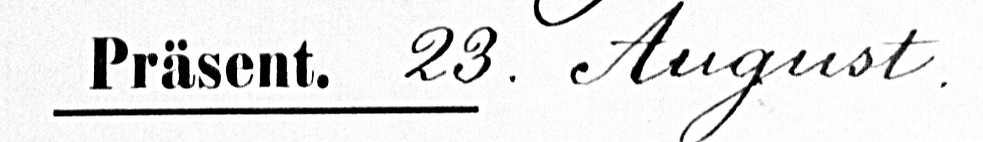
Präsent. 23. August.
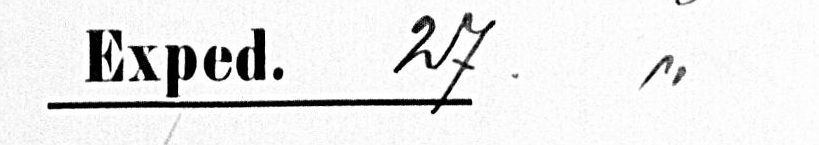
Exped. 27. August.
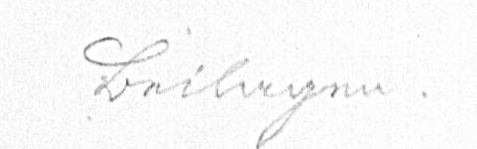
Beilagen.
